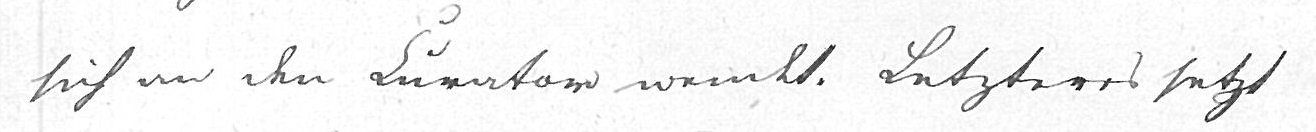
sich an den Curator wendet. Letzteres setzt
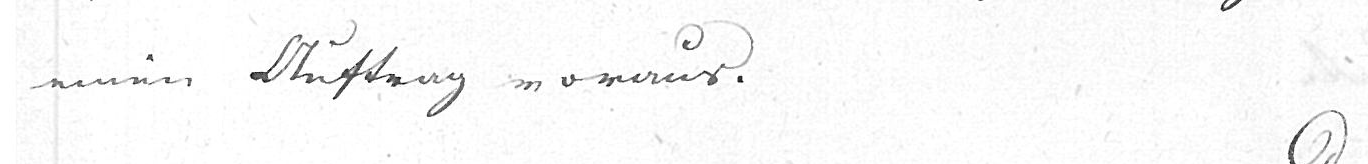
einen Auftrag voraus.
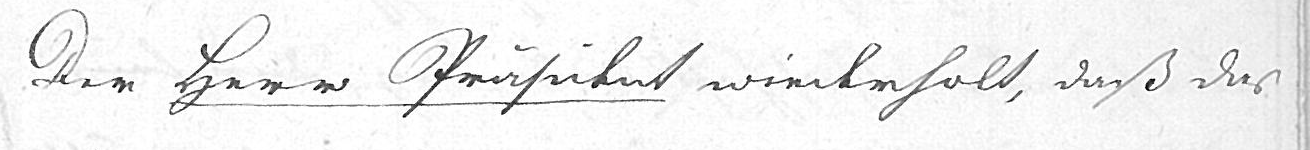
Der Herr Präsident wiederholt, daß das
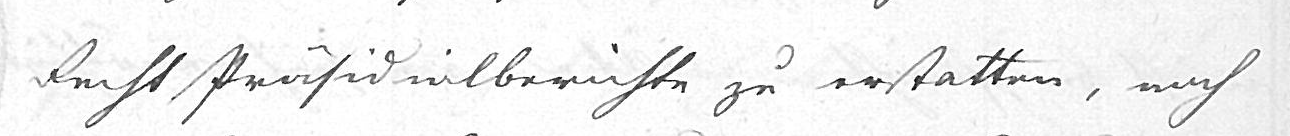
Recht Präsidialberichte zu erstatten, nach
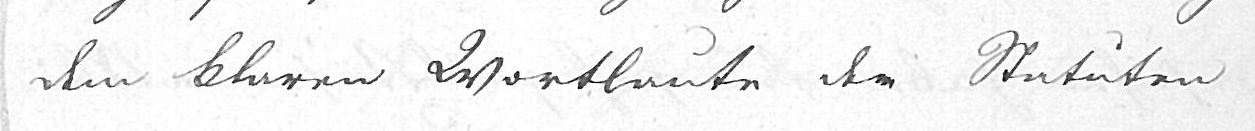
den klaren Wortlaute der Statuten
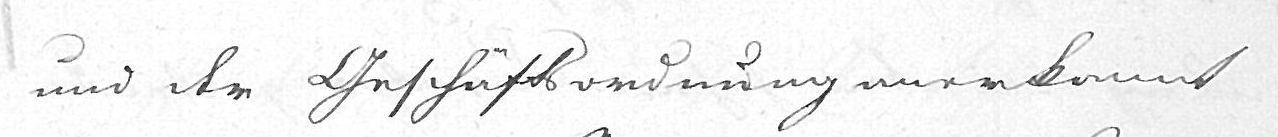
und der Geschäftsordnung anerkannt
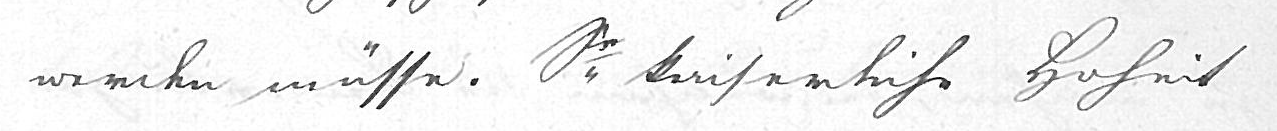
werden müsse. Sr. kaiserliche Hoheit
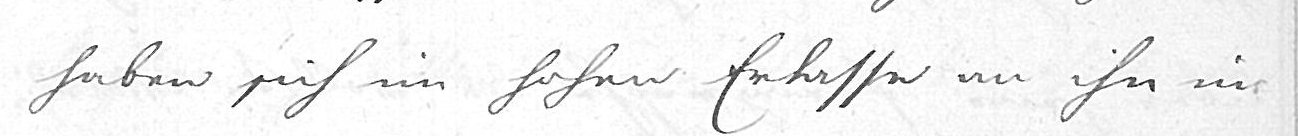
haben sich im hohen Erlasse an ihn in
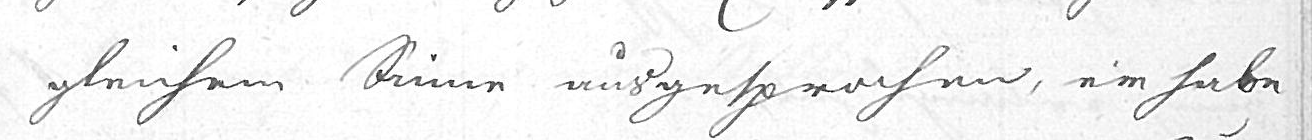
gleichem Sinne ausgesprochen, er habe
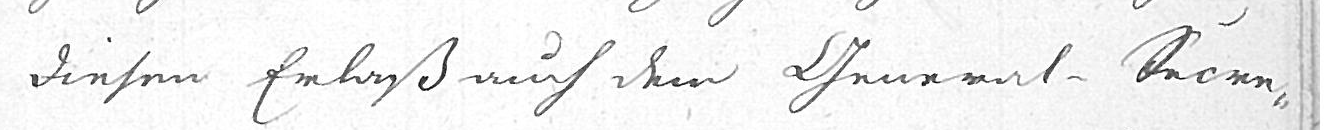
diesen Erlaß auch dem General-Secre-
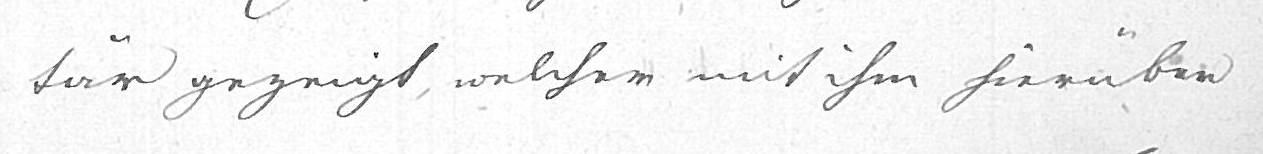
tär gezeigt, welcher mit ihm hierüber
